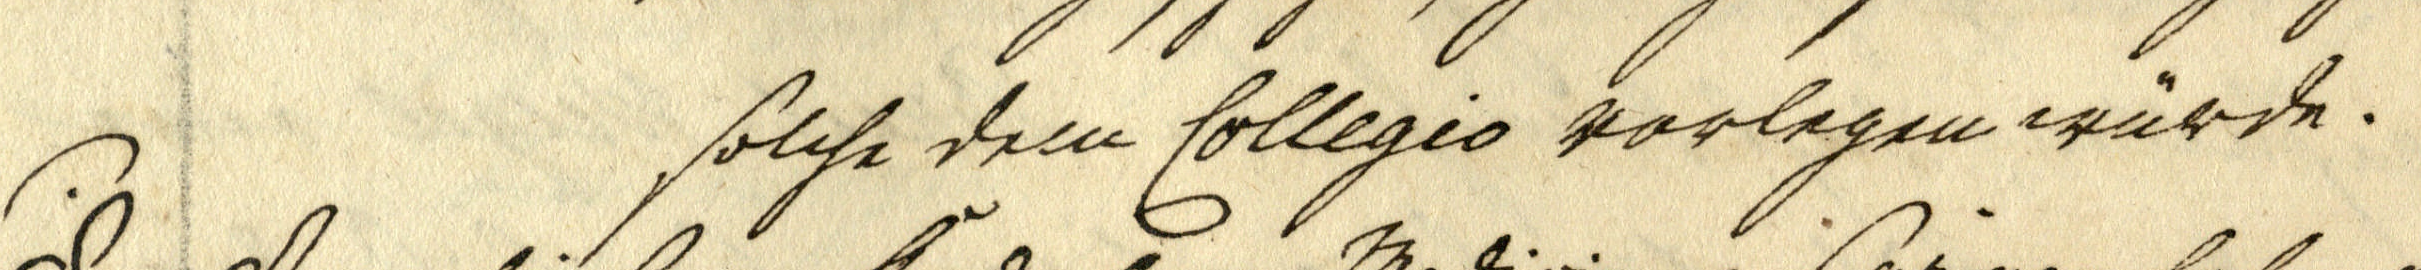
solche dem Collegio vorlegen würde
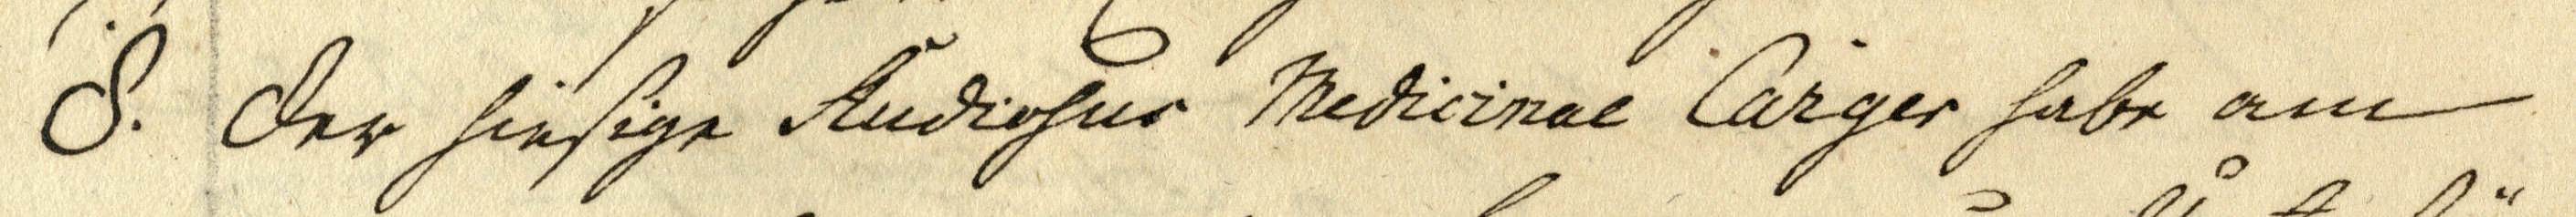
Da Der hiesige Syndicum Medicina Klaeger habe wie
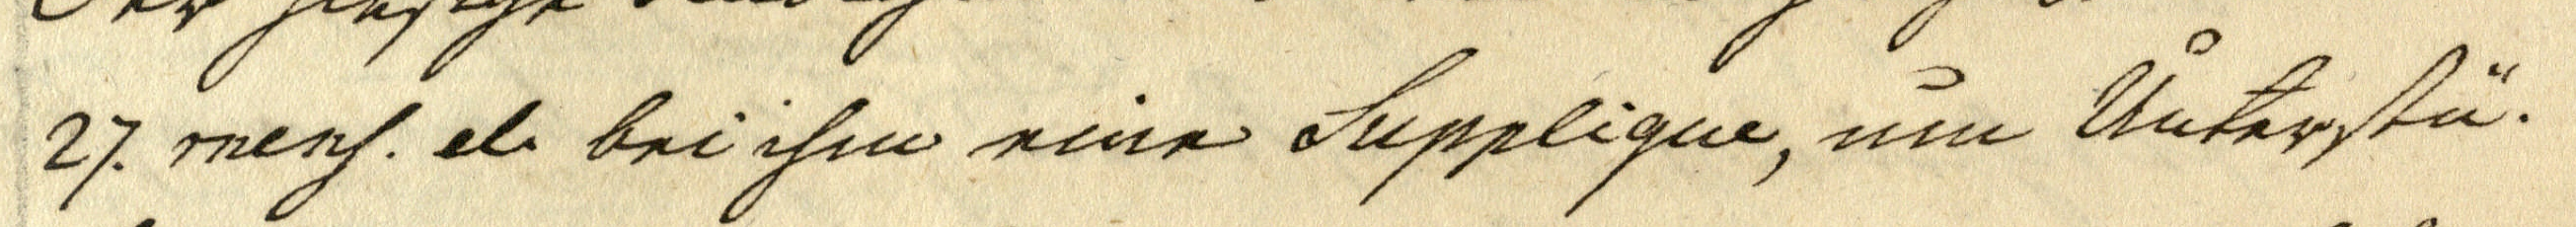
Mit mens el bei ihm einen Supplican , um Unter stün
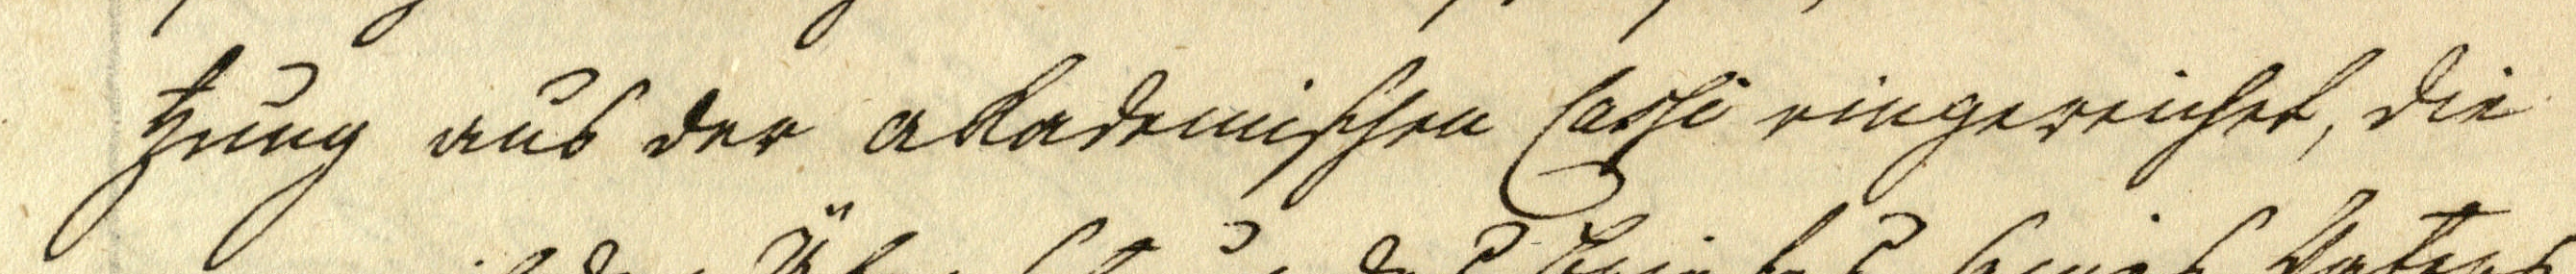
tzung aus der akademischen sich eingereichet die
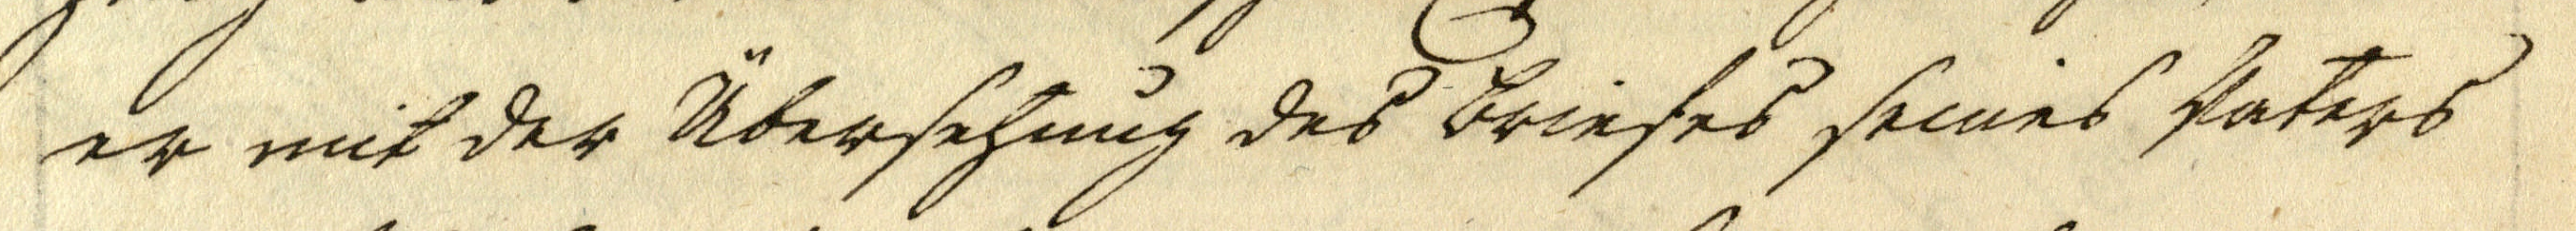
der mit der Untersuchung des tiefes seines Vaters
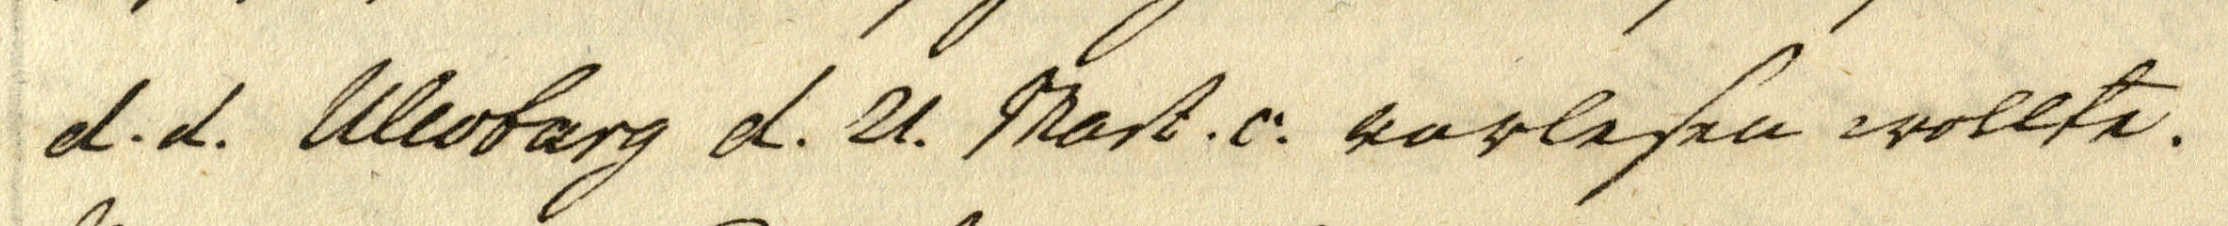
ad A Belohnung ad A . Mart . verlesen wollte
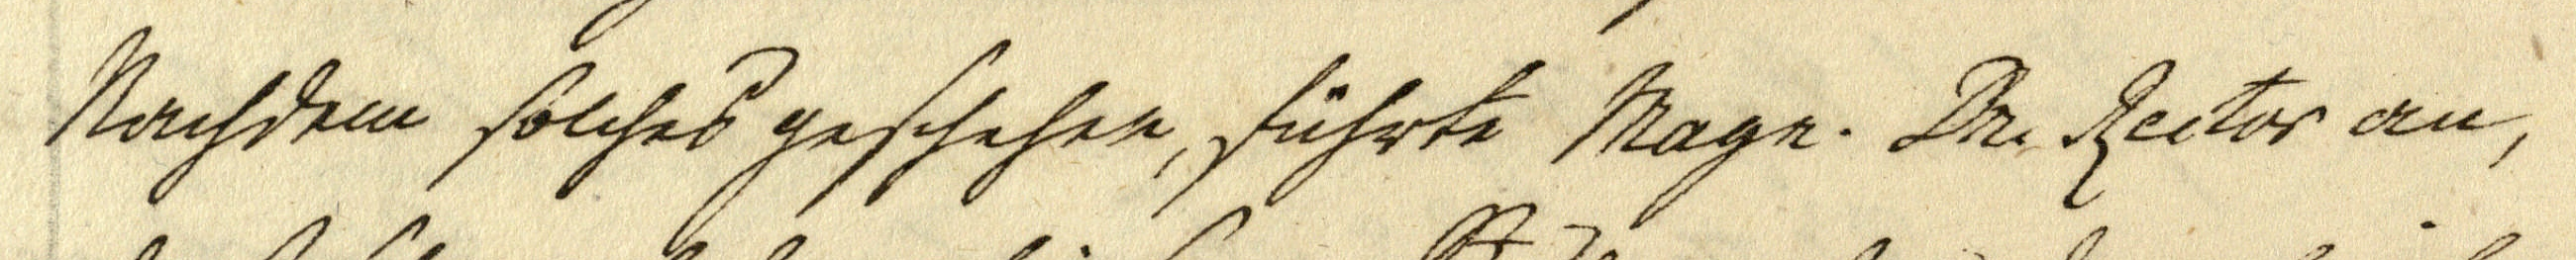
Nachdem solches geschehen führt Magn . Dn Rector an
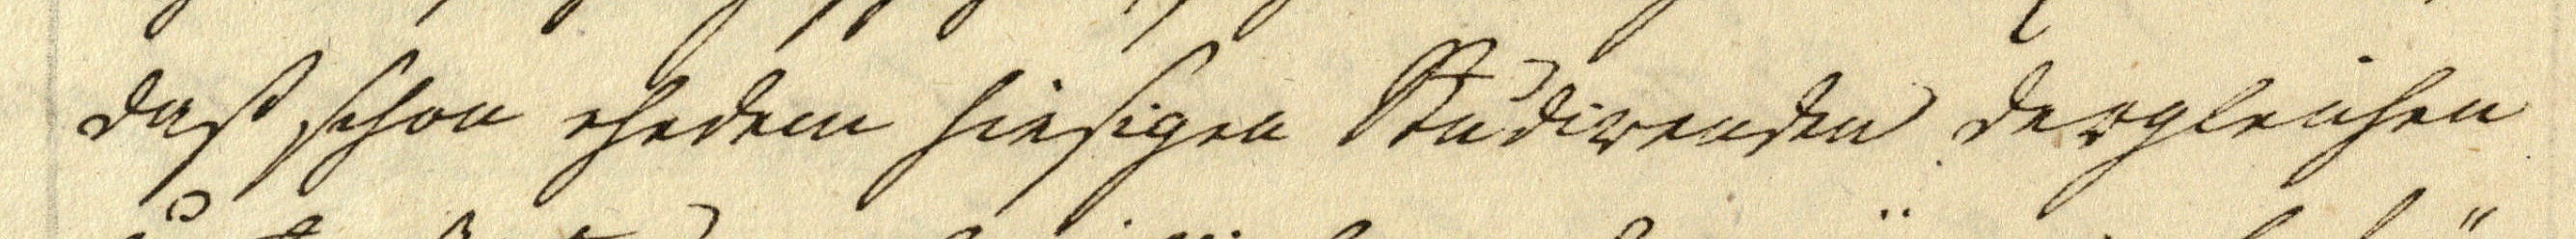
daß schon erhabenen hiesigen Studirenden dergleichen
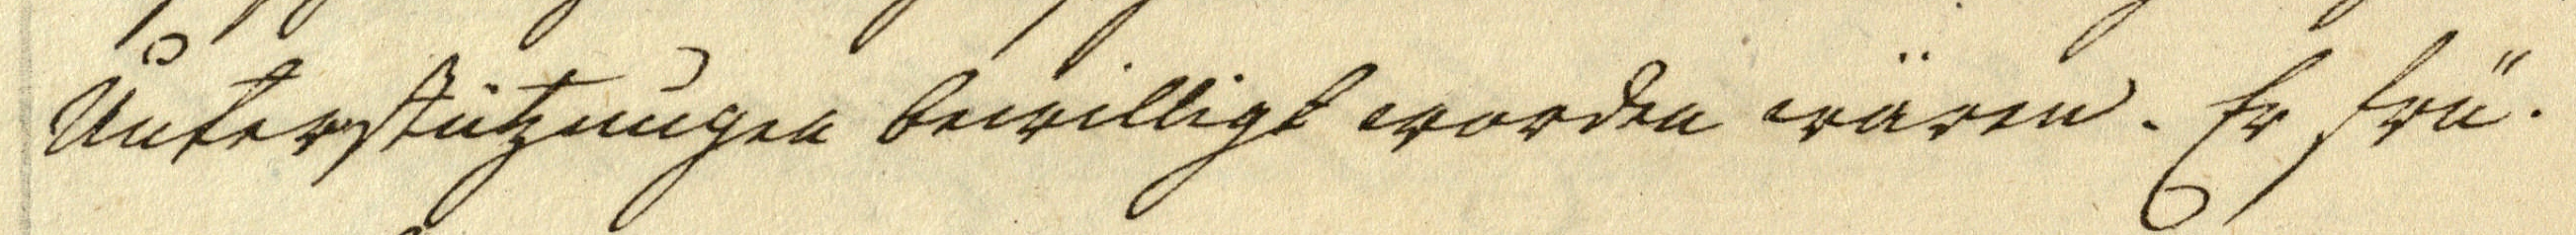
Unterstützungen bewilligt worden wären . so frei
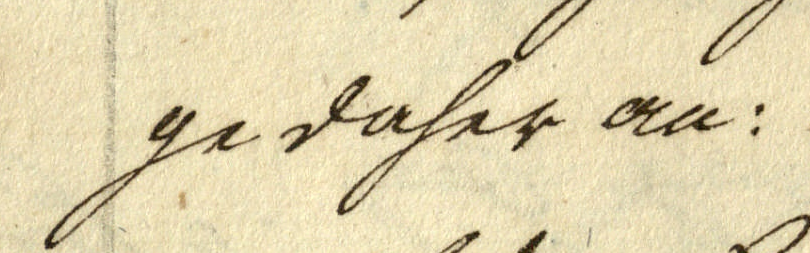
ge . an
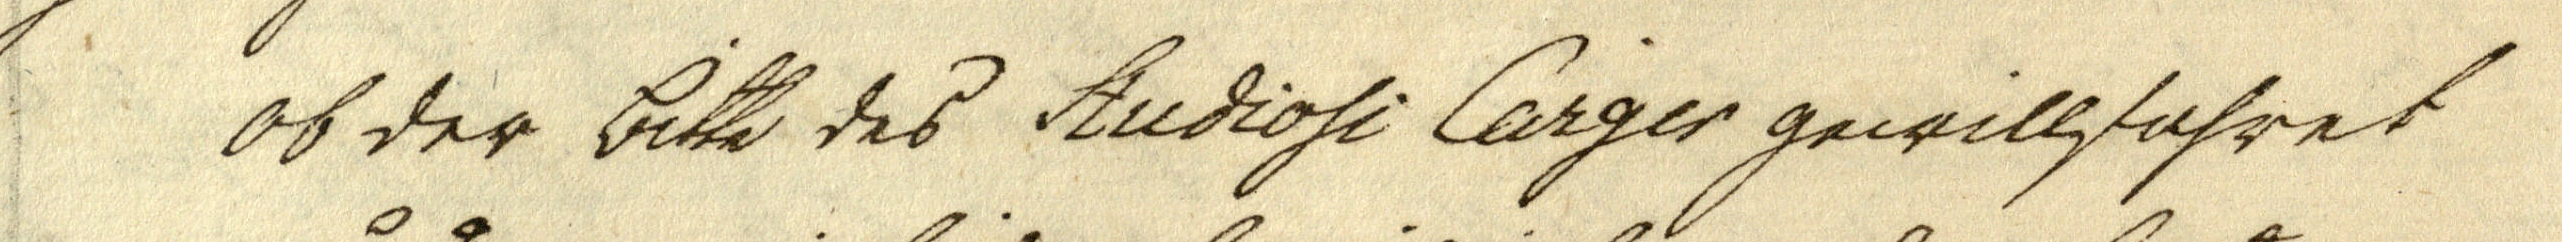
Ab der Bett des Studiosi klagen gewillfahret
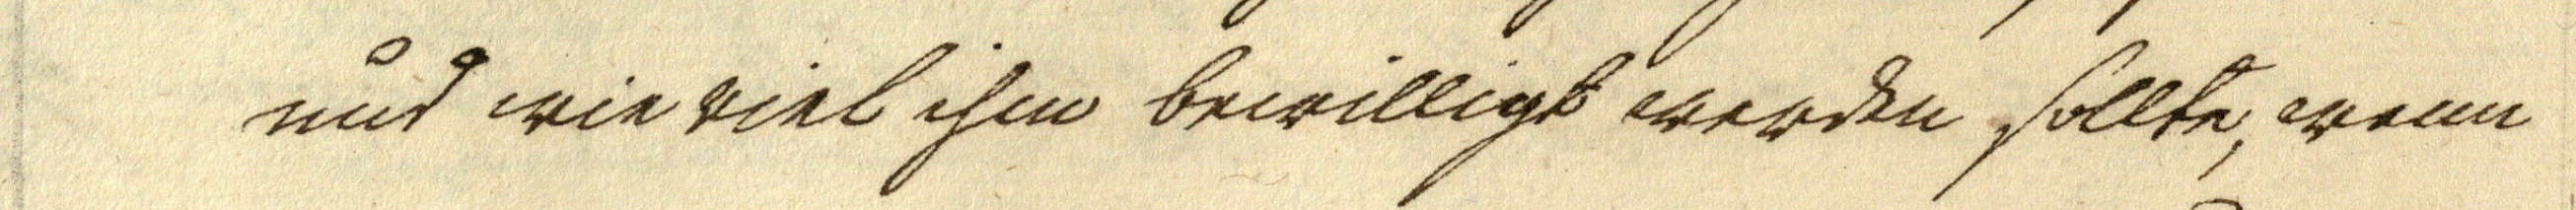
und wie viel ihm bewilligt werden sollte wann
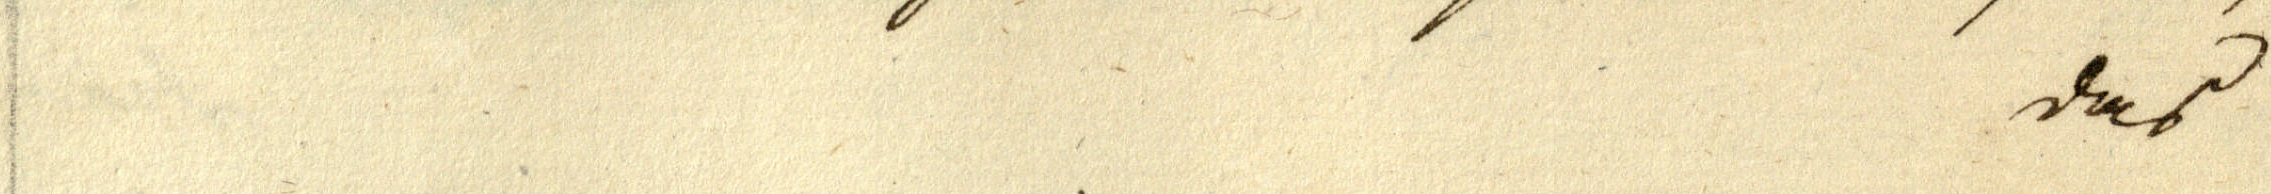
ob
